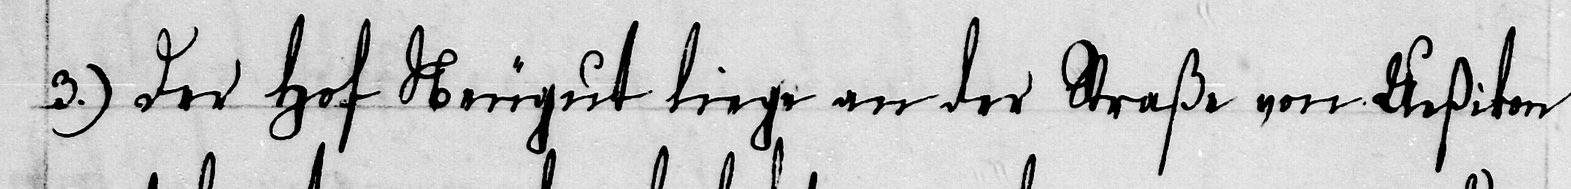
3.) Der Hof Neugut liege an der Straße von Ueßikon
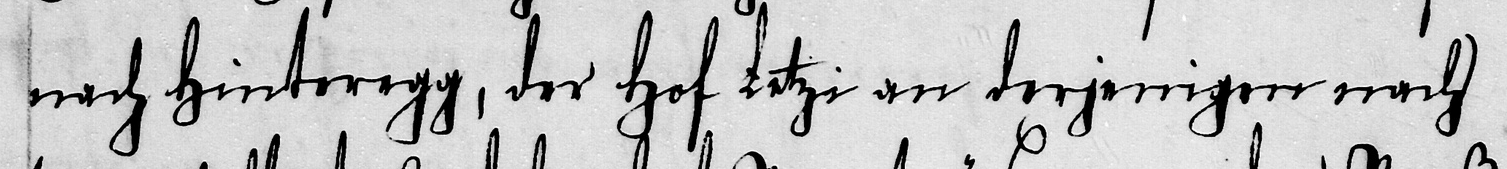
nach Hinteregg, der Hof Letzi an derjenigen nach
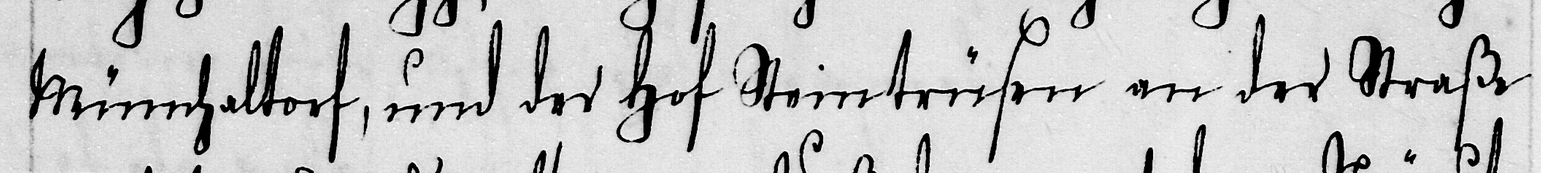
Münchaltorf, und der Hof Steintrüsen an der Straße
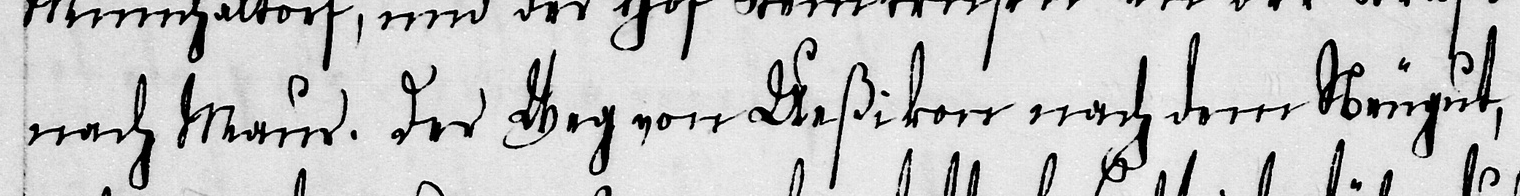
nach Maur. Der Weg von Ueßikon nach dem Neugut,
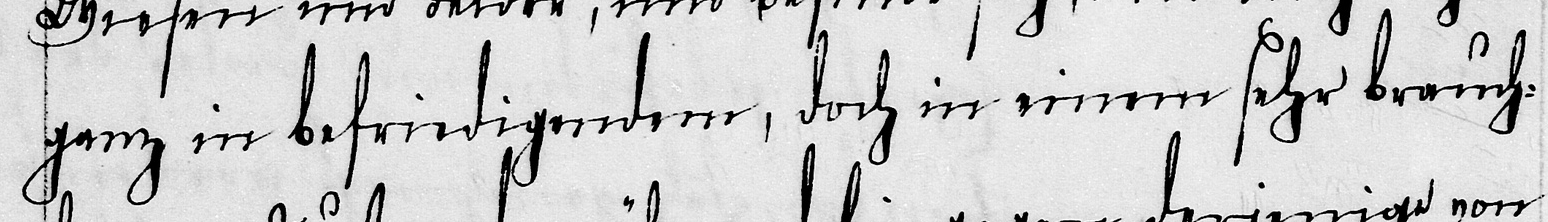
ganz in befriedigendem, doch in einem sehr brauch¬
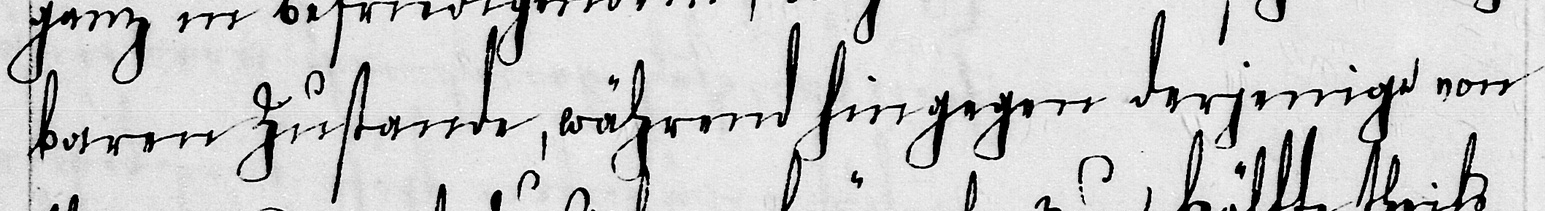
baren Zustande, während hingegen derjenige von
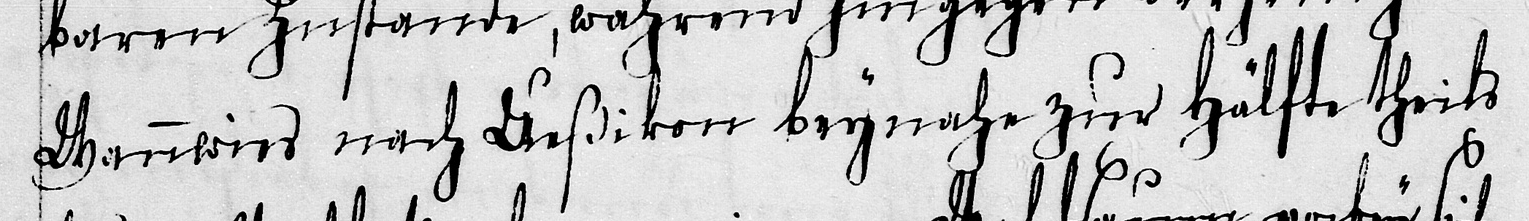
Wannwies nach Ueßikon beynahe zur Hälfte theils
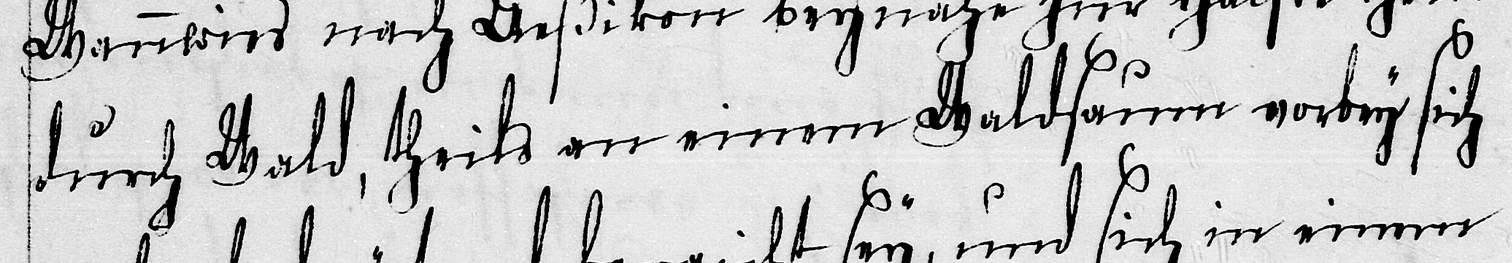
durch Wald, theils an einem Waldsaum vorbey sich
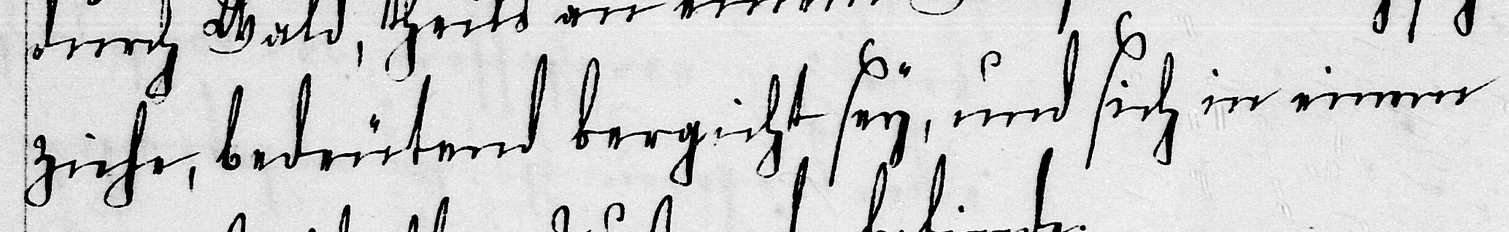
ziehe, bedeutend bergicht sey, und sich in einem
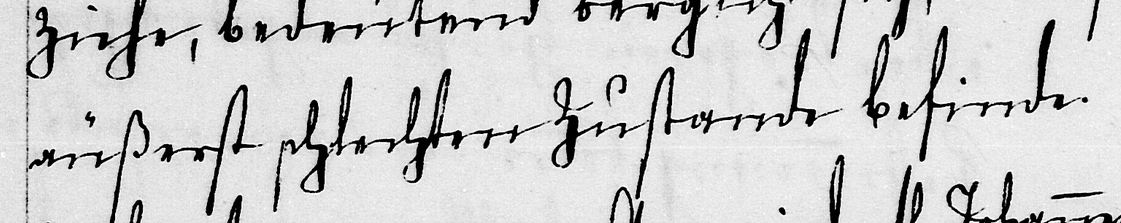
äußerst schlechten Zustande befinde.
